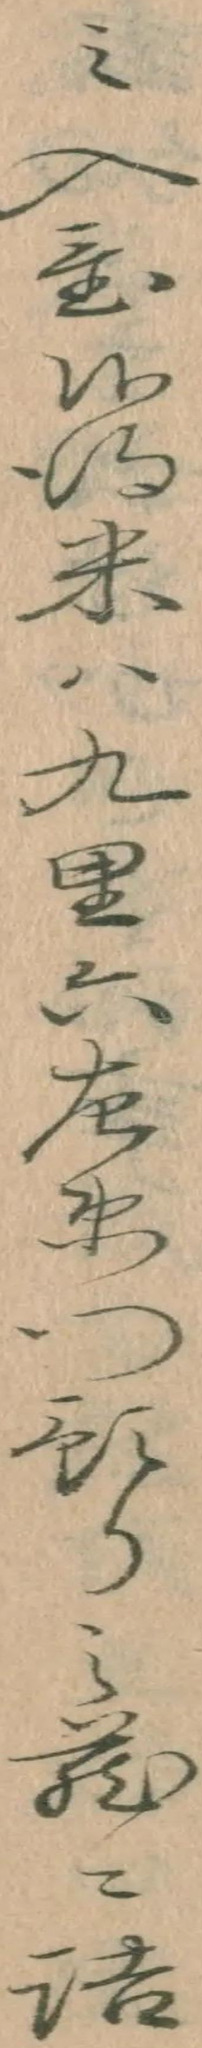み入置候得米は九里六左衛門預り之蔵に詰
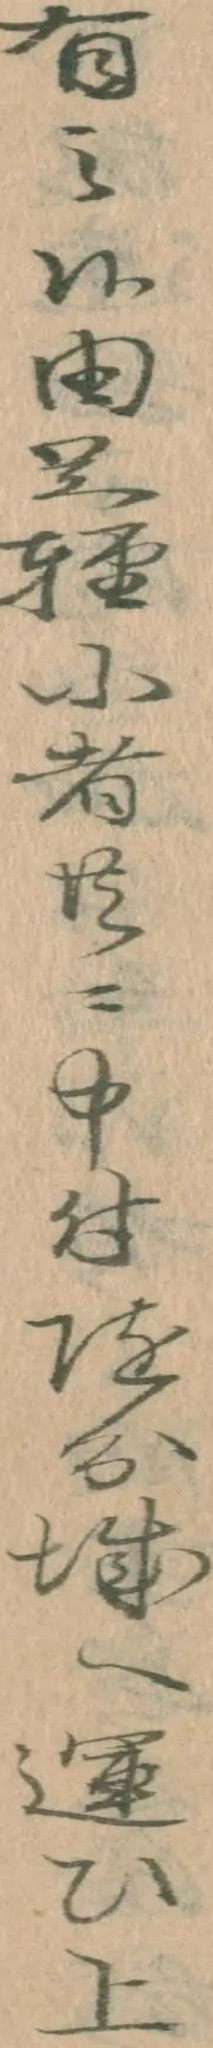有之候由足軽小者共に申付随分城へ運ひ上
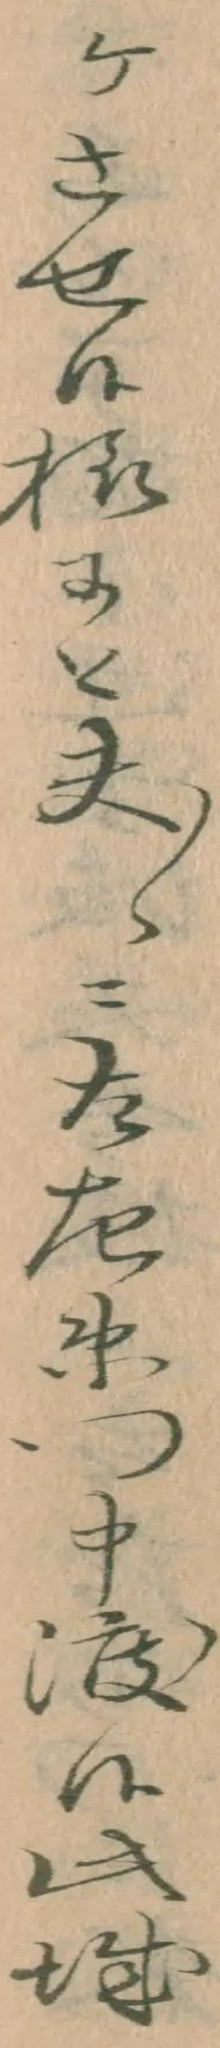けさせ候様尓と夫々に太左衛門申渡候此城
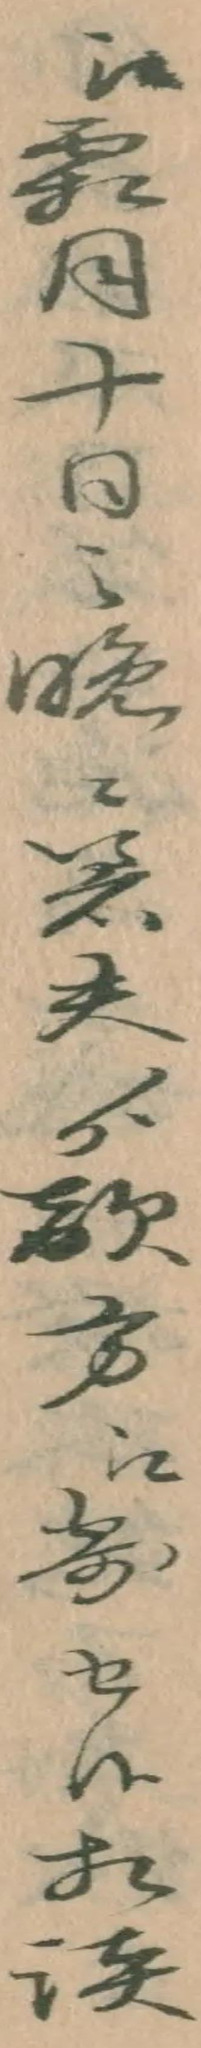江霜月十日之晩に着夫ゟ敵方江寄せ候相談
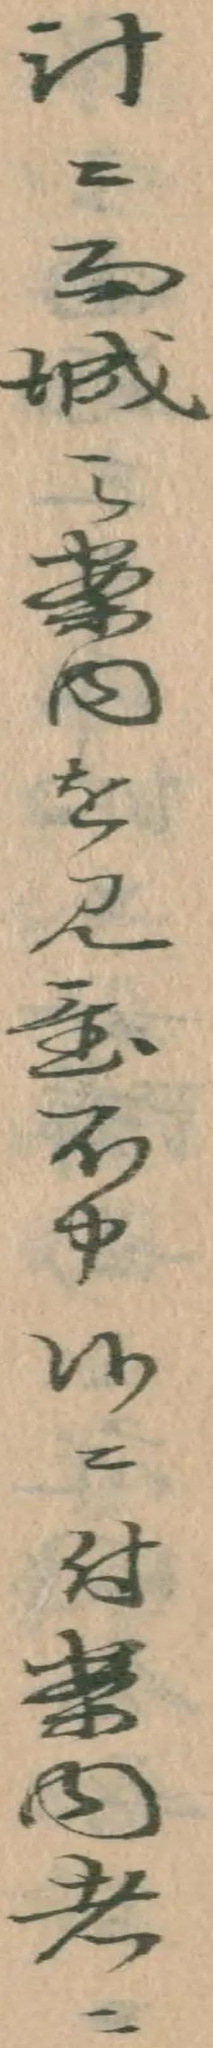斗に而城之案内を見置不申候に付案内者に
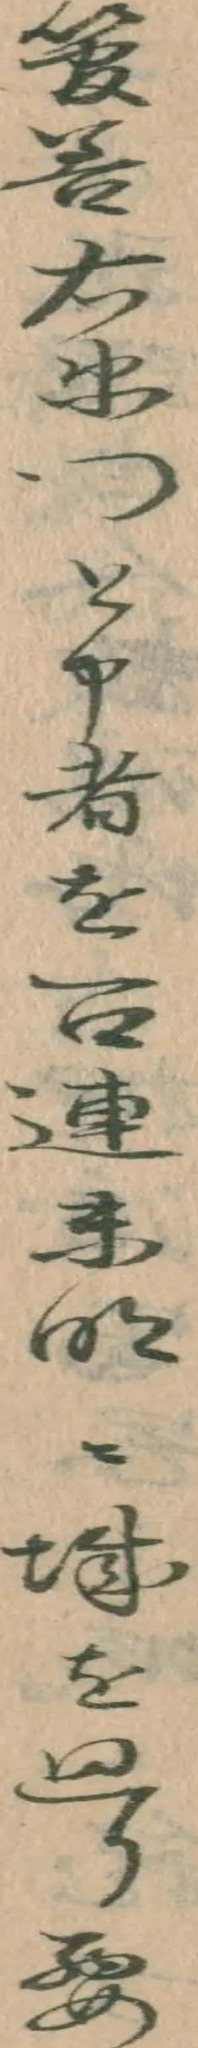管善右衛門と申者を召連未明に城を廻り要
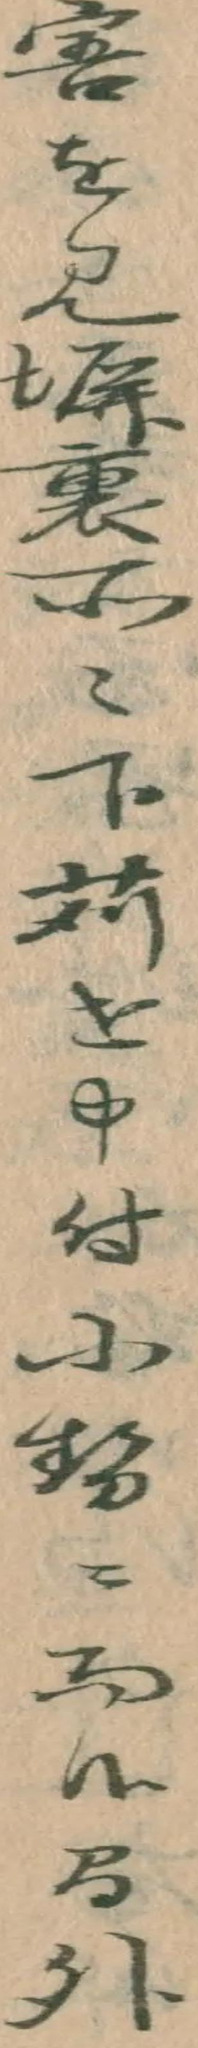害を見塀裏所に下苅を申付小勢に而候間外
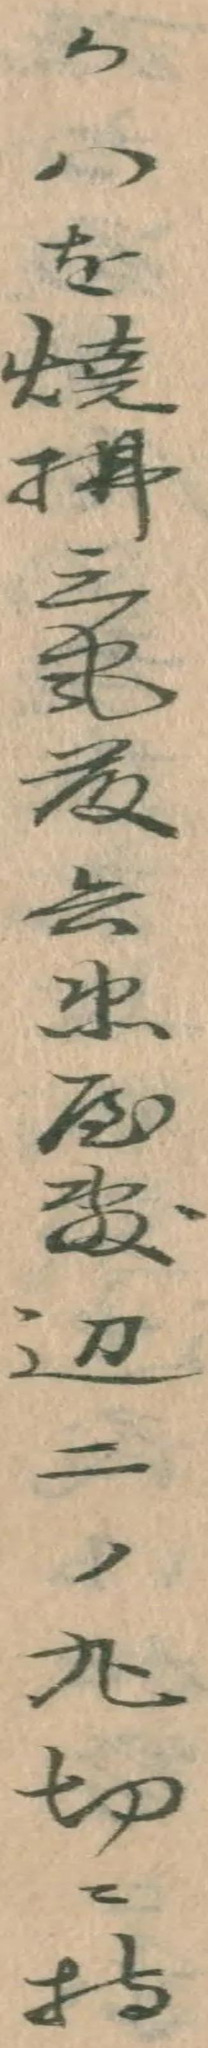かはを焼払三宅藤兵衛屋敷辺二之丸切に持
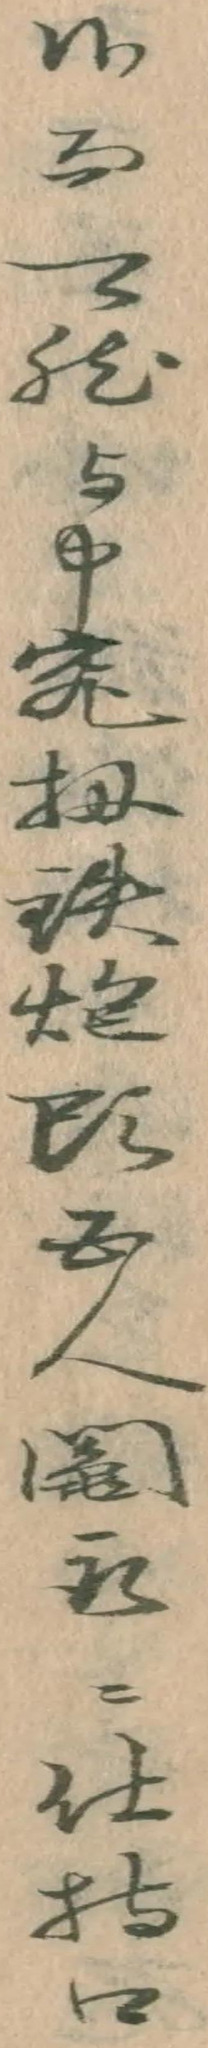候而可然与申究扨鉄砲頭五人鬮取に仕持口
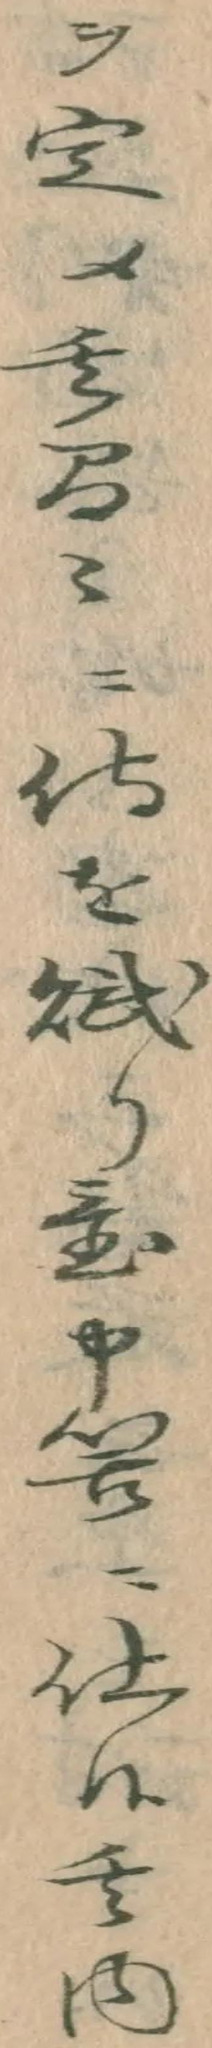を定め其間々に侍を賊り置申筈に仕候其内
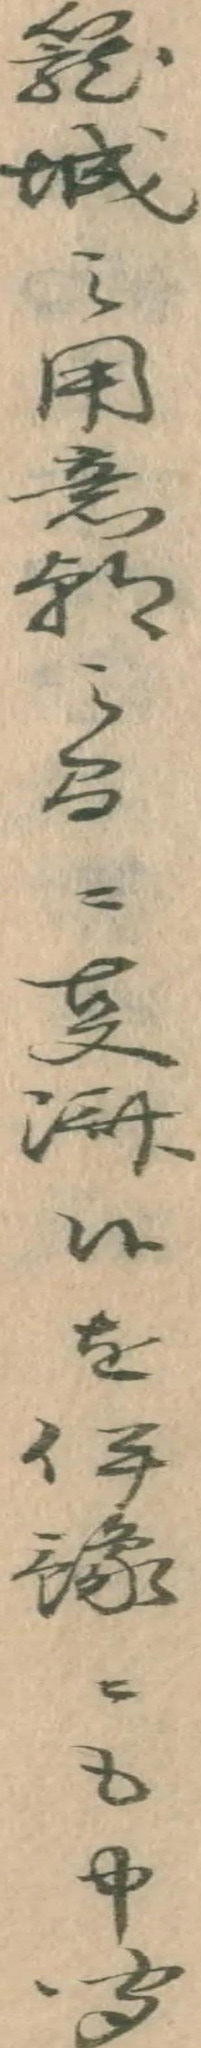籠城之用意朝之間に事済候を伊予にも申聞

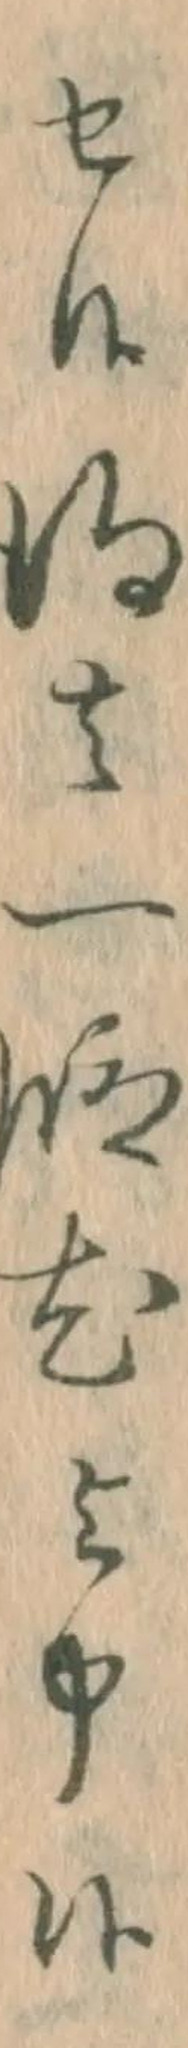せ候得者一段尤与申候
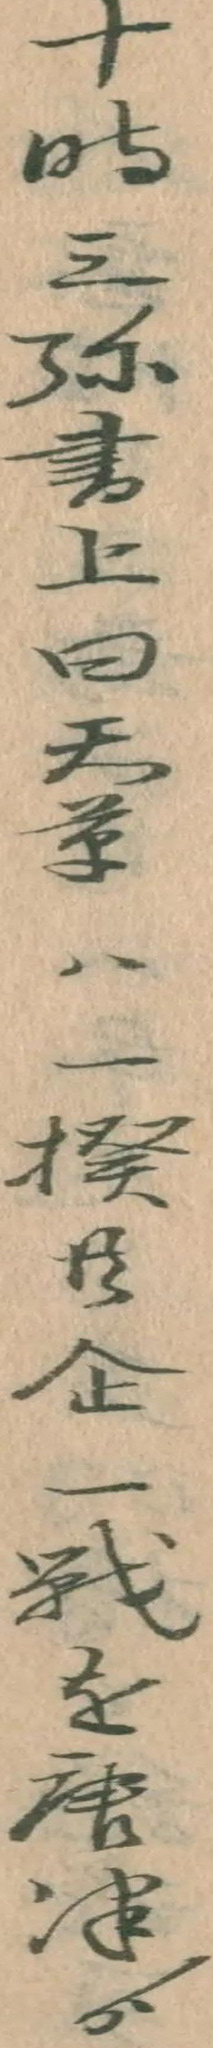十時三弥書上曰天草は一揆共企一戦を唐津ゟ
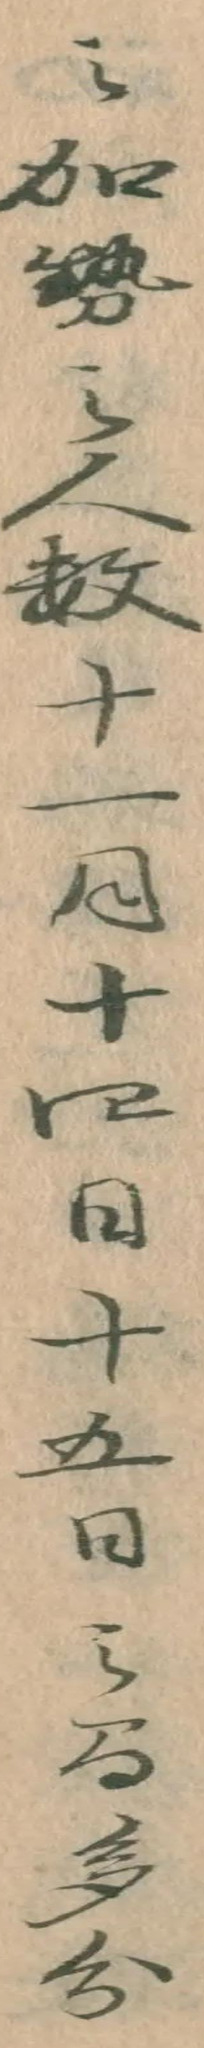之加勢之人数十一月十四日十五日之間多分
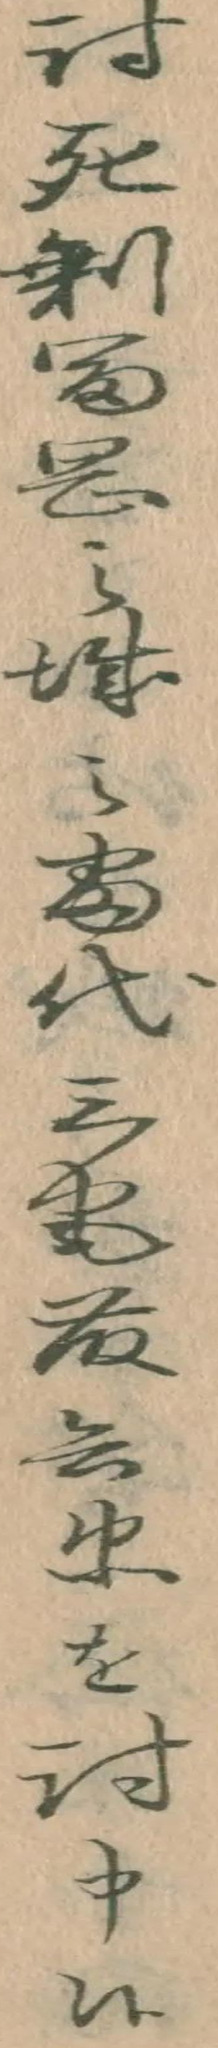討死剰冨岡之城之番代三宅藤兵衛を討申候
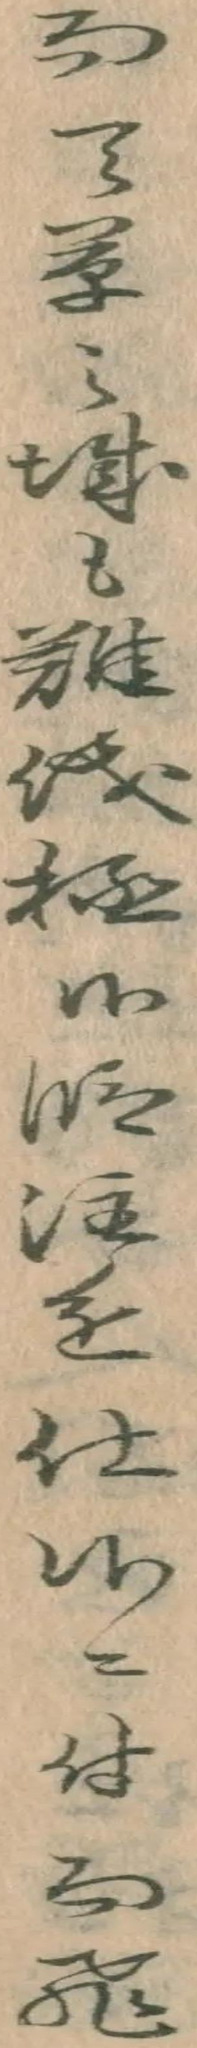而天草之城も難儀極候段注進仕候に付而飛
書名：切支丹御退治記 49巻. [2]
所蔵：国立国会図書館 National Diet Library, JAPAN
